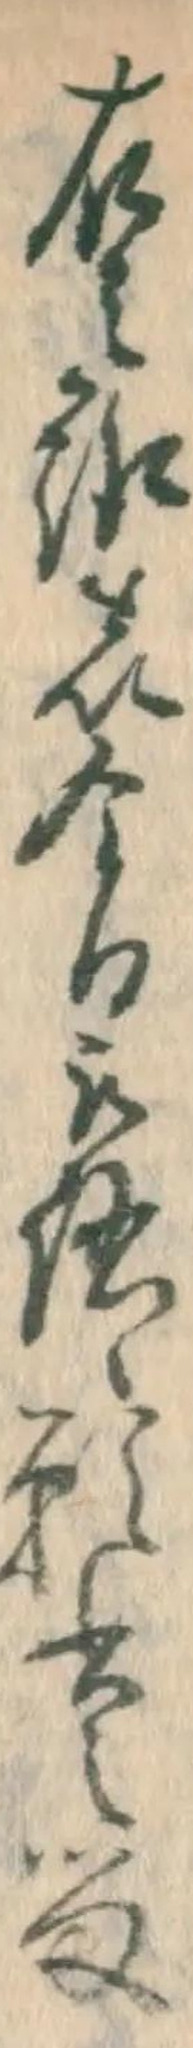右之趣を以今日被認候願書之留
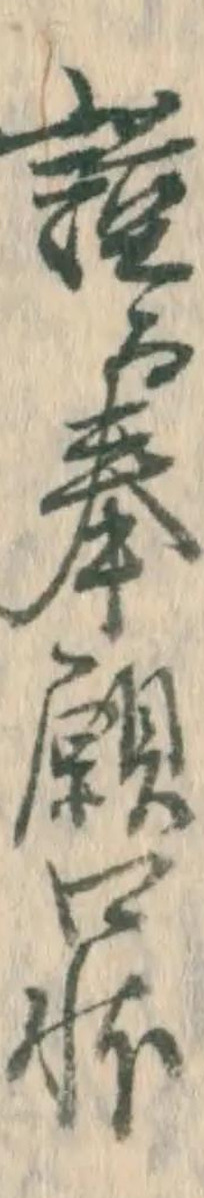謹而奉願口状
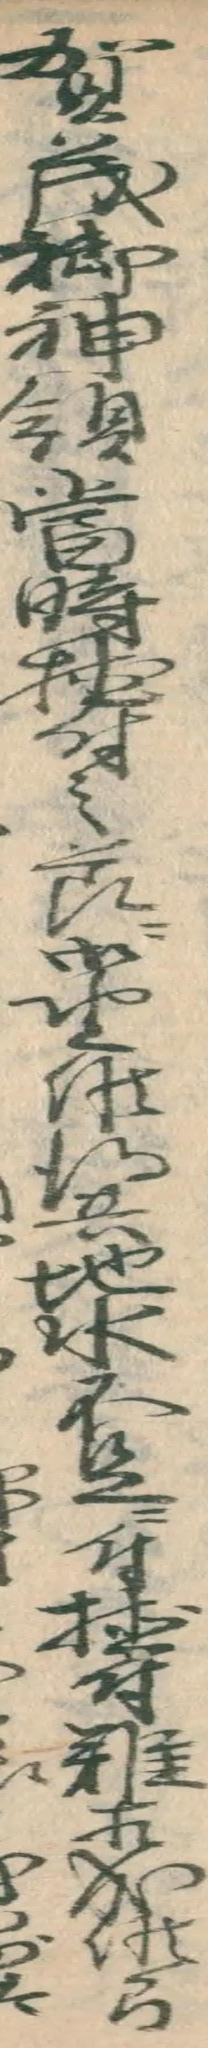賀茂御神領当時植付之節ニ御座候得共地水不足ニ付植付難相成候間
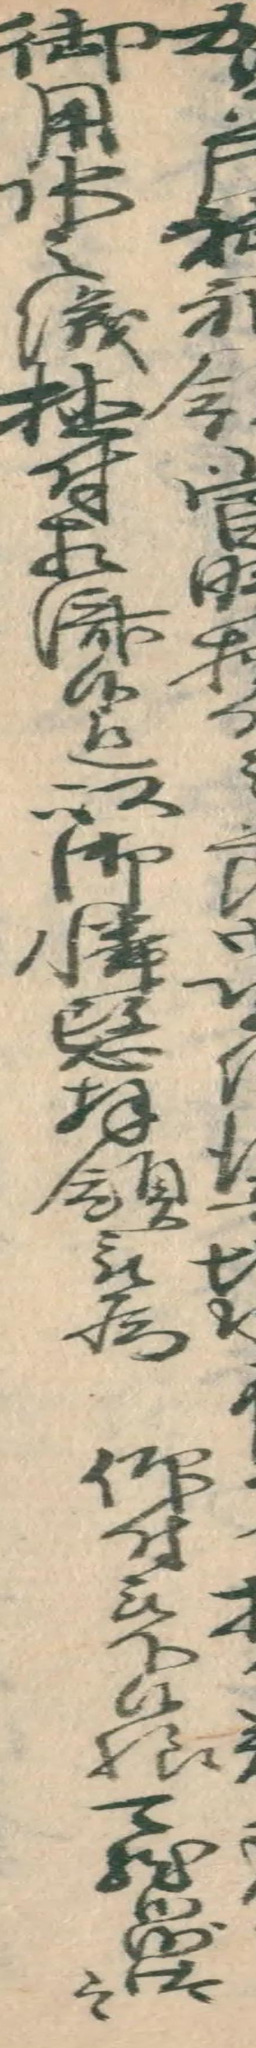御用水之儀植付相済候迄以御憐愍拝領被為仰付被下候様可然御沙汰候ハヽ
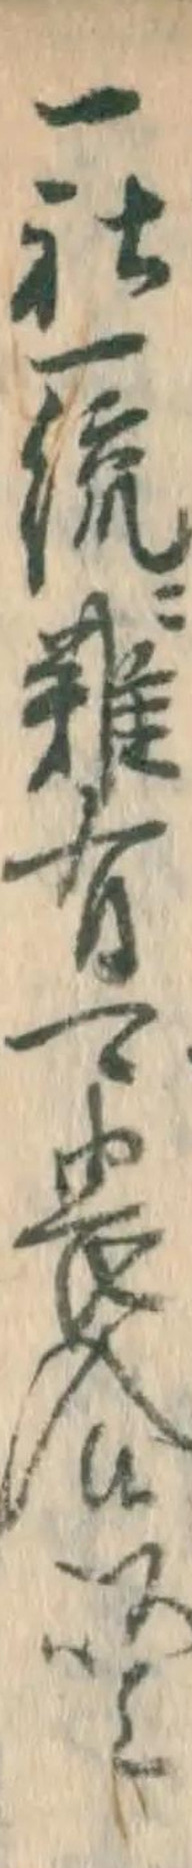一社一統ニ難有可畏入候以上

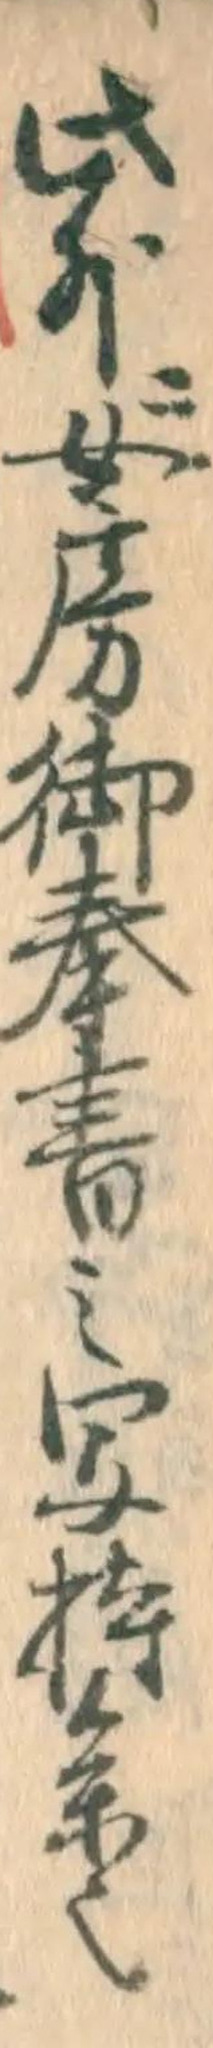此外ニ女房御奉書之写持参也
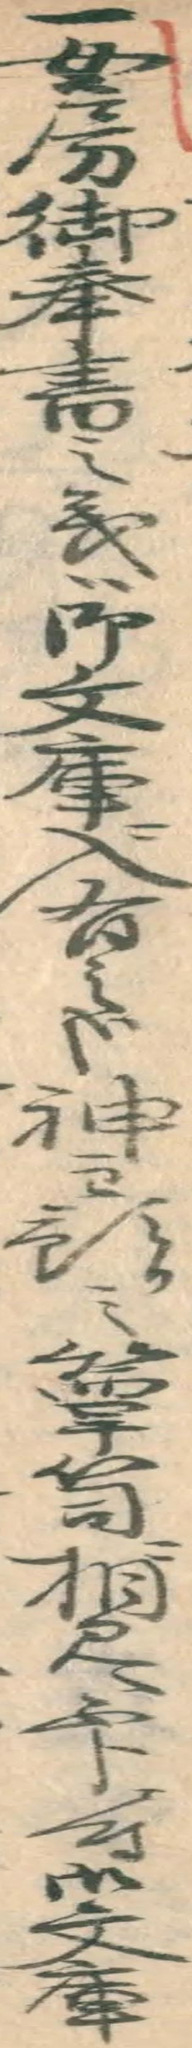一女房御奉書之義ハ御文庫ニ入有之哉神主預り之箪笥ニ相見へ不申ニ付御文庫
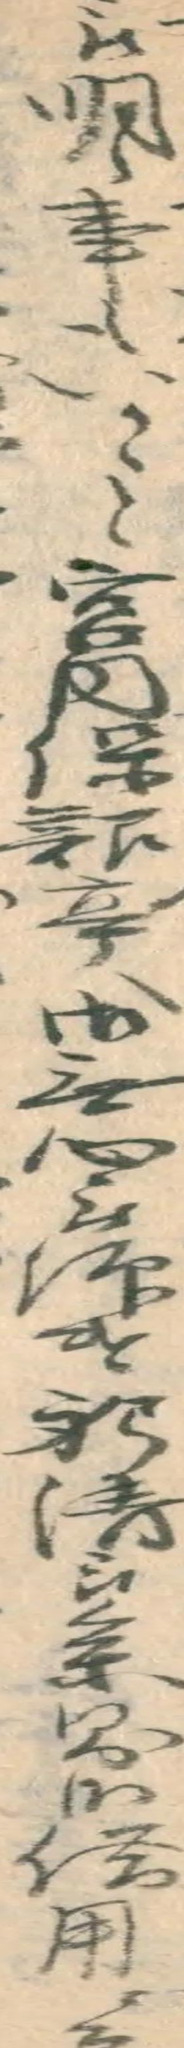被明候事もいかゝと宮内保韶亭へ御無心被仰遣躬清被参則御借用ニ而
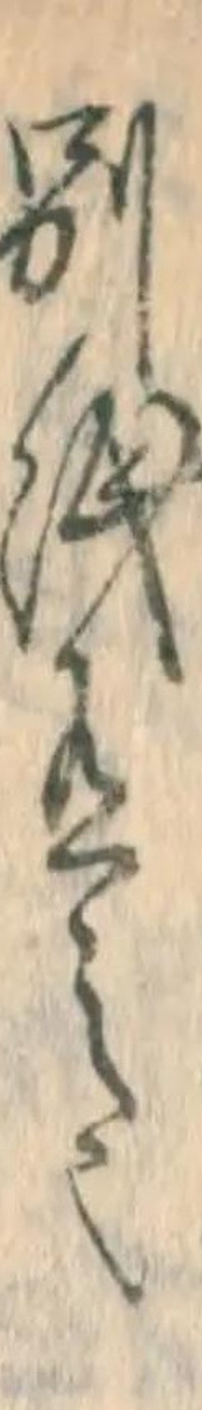別紙有之也
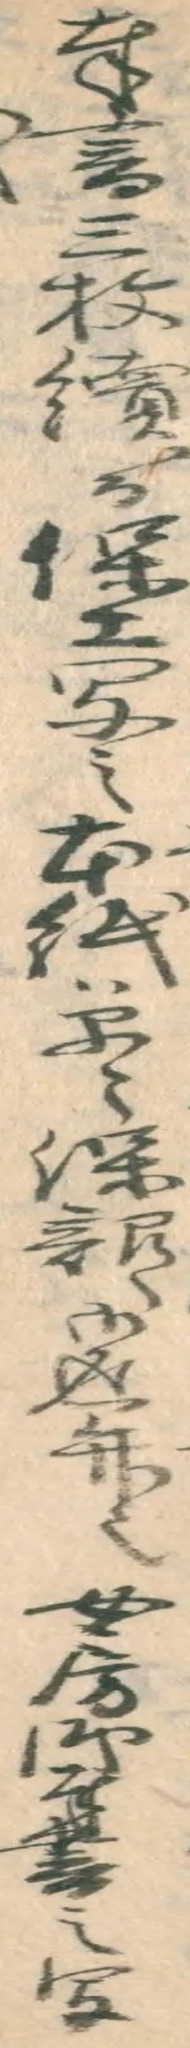奉書三枚続ニ而保土写之本紙ハ早々保韶へ御返弁也女房御奉書之写
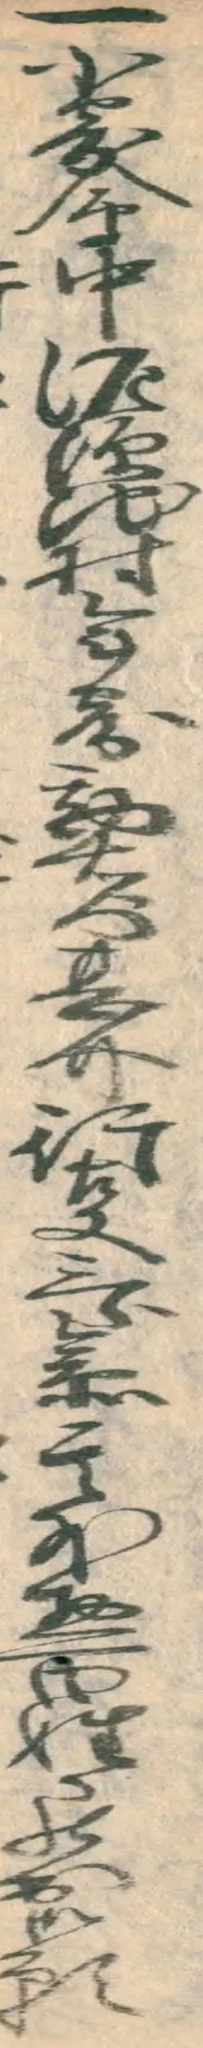一小寄会中泥深池村年寄勘右衛門甚介行事三郎兵衛其外惣百姓罷出御願
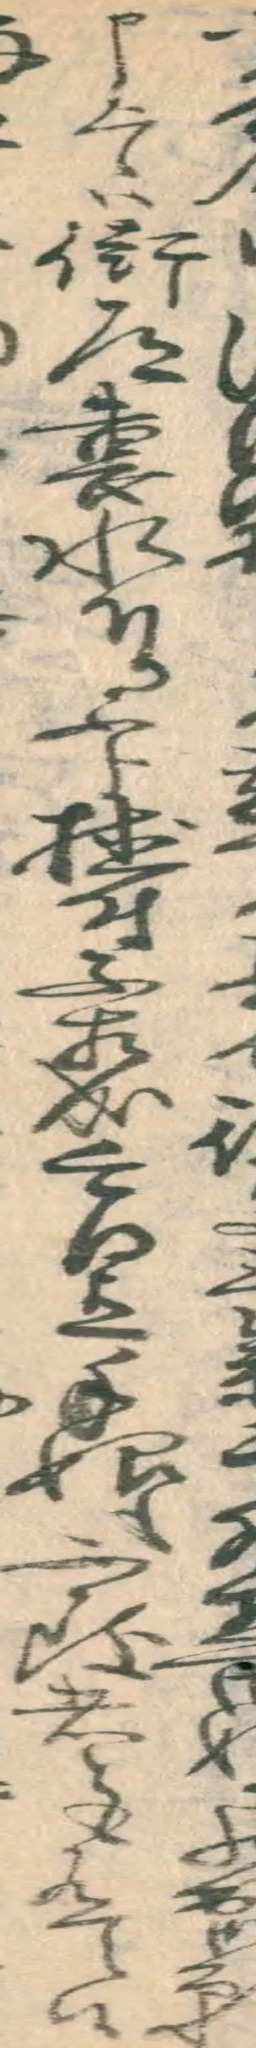申上候ハ街道裏水下り不申植付不相成今日迄手始も不致者とも有之候
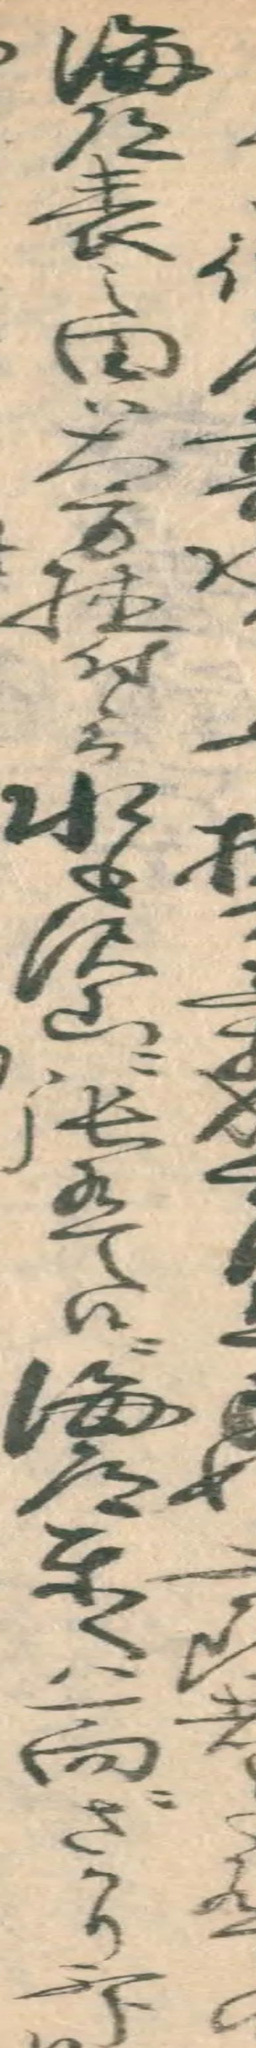海道表之田ハ大方植付候而水も沢山ニ張有之候ニ海道東へハ一向ニさかり不申候
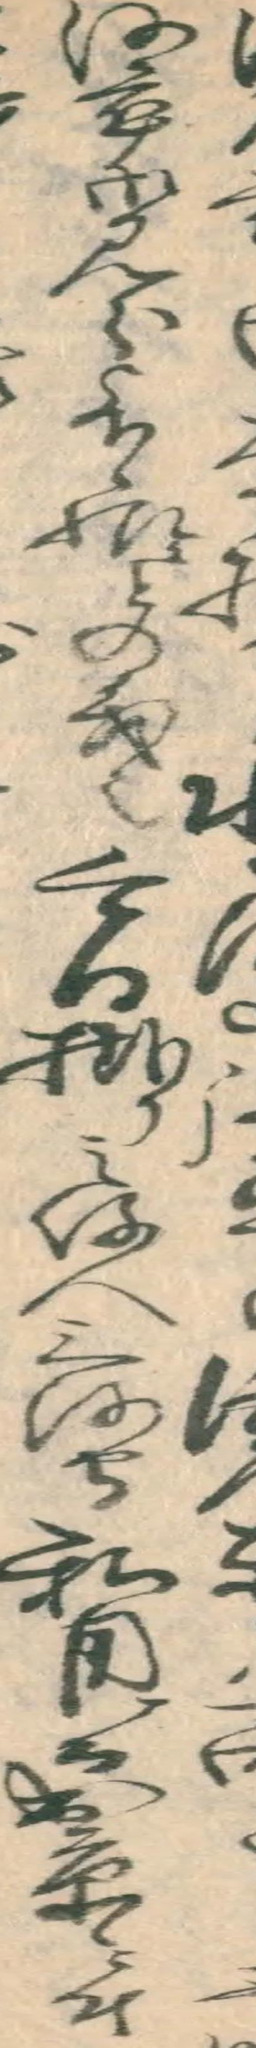何卒御見分被下候様との義也今日掛り之役人三河守私用ニ而出京候ニ付
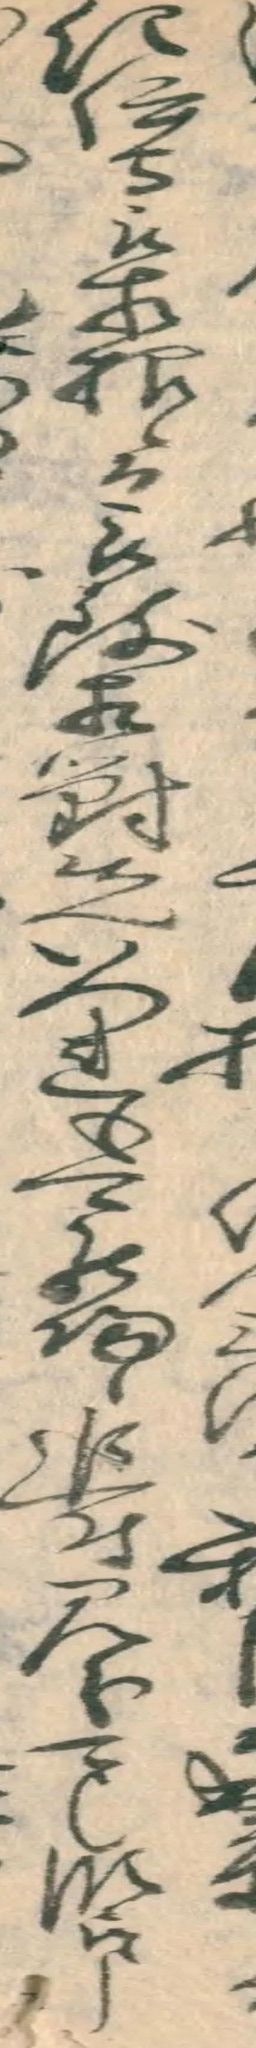紀伊守被相招候而被致相対先いつれも可罷帰候追付見分可申候段被申
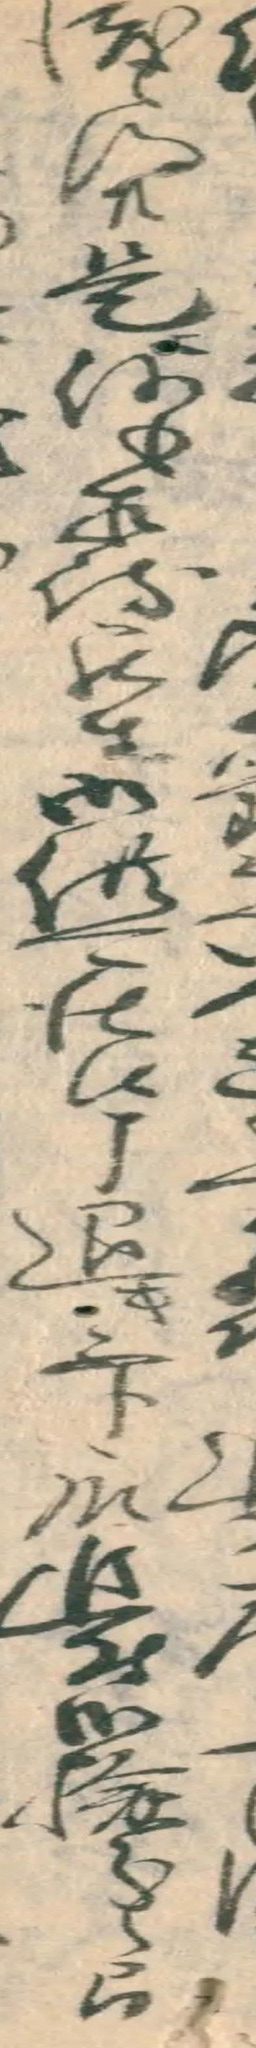渡候得共是ニ何も相待罷在御供可仕由申退キ不申候故追付御検分候間
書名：賀茂社記録. 第58冊
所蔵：国立国会図書館 National Diet Library, JAPAN
